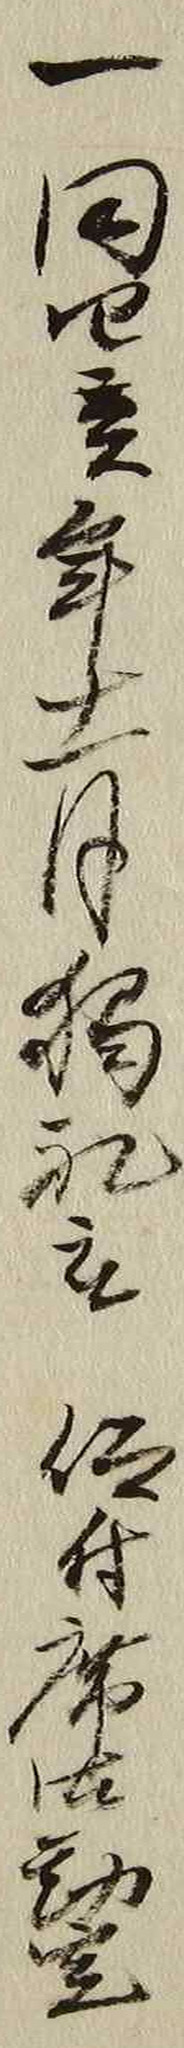一同四亥年十一月独礼被仰付席御勘定
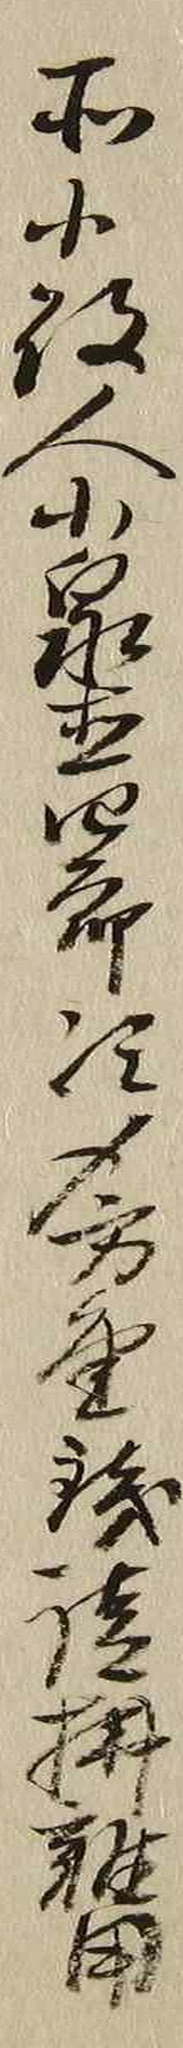所小役人小泉直四郎次〆方金銭請払雑用
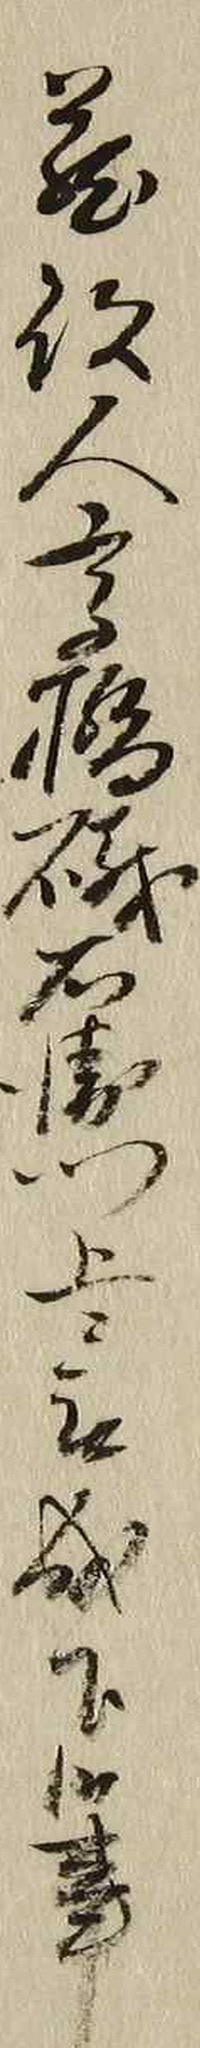蔵役人高橋磯右衛門上被成下候事
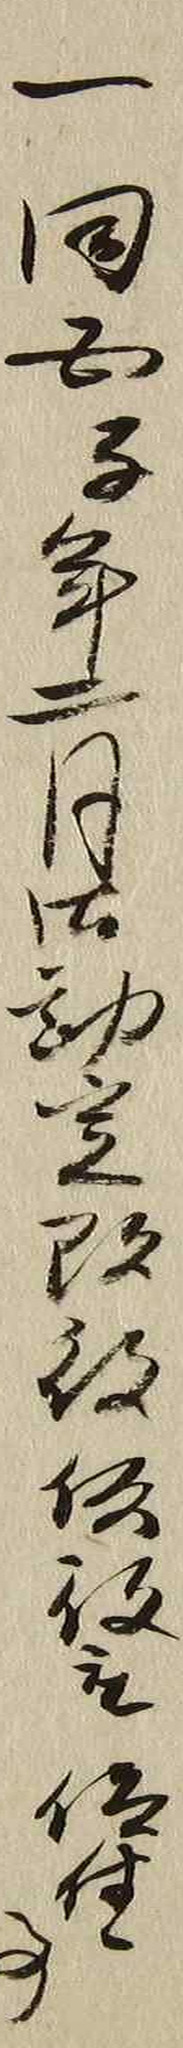一同五子年二月御勘定改役仮役被仰付候事
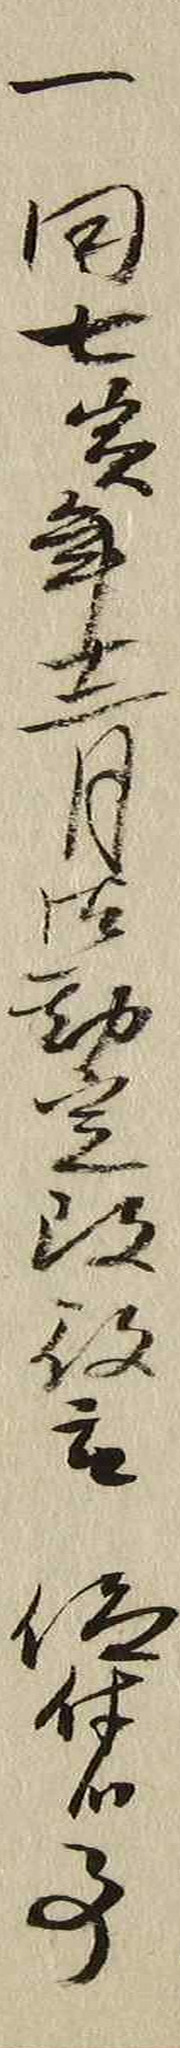一同七寅十二月御勘定改役被仰付候事
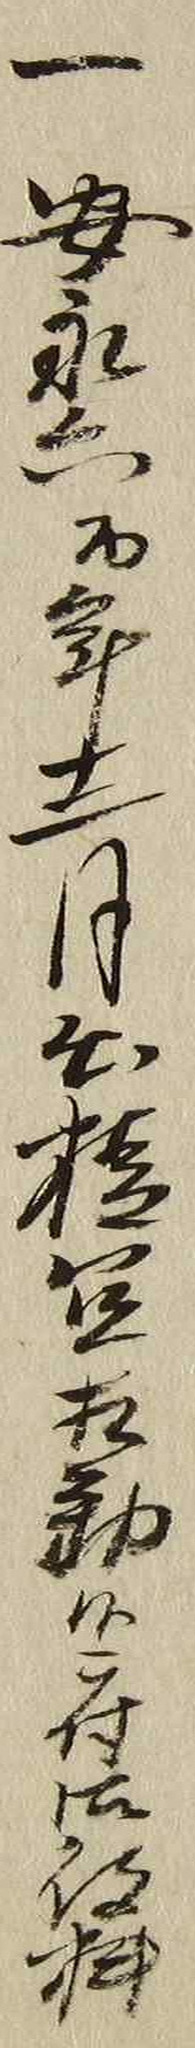一安永六酉年十二月出精宜相勤候付御役料
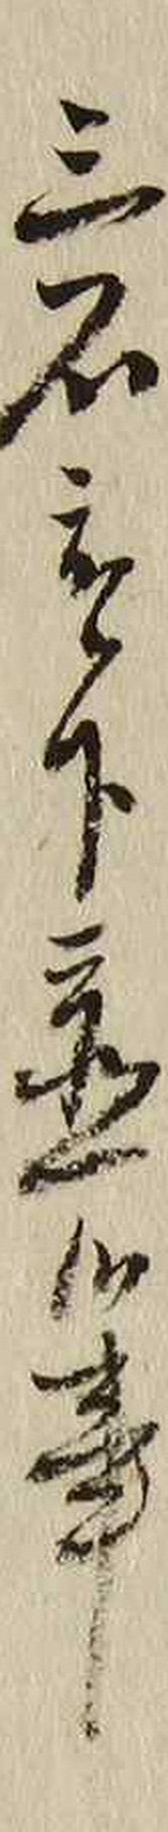三石被下置候事
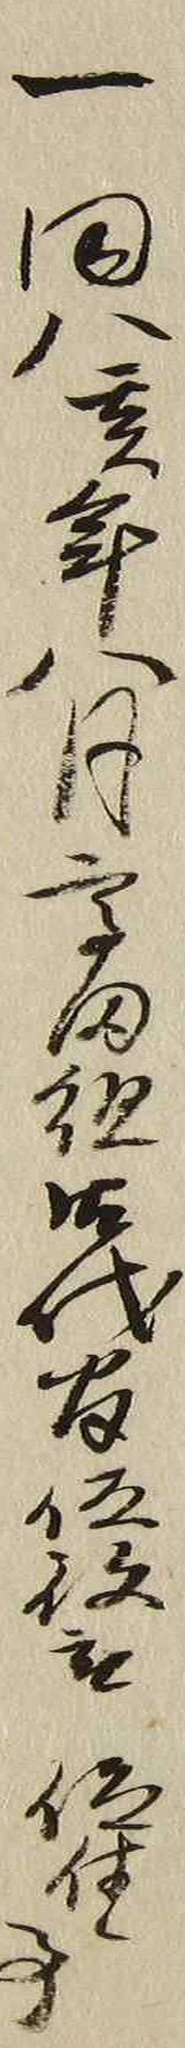一同八亥年八月高田組御代官仮役被仰付候事
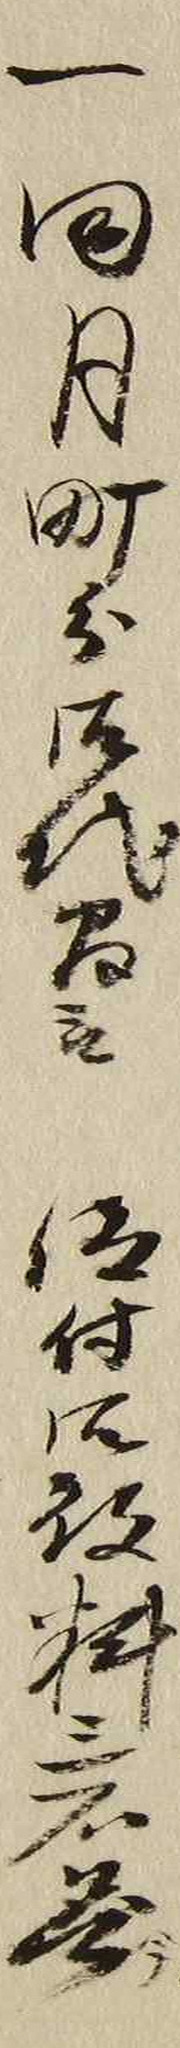一同月町分御代官被仰付御役料三石只今
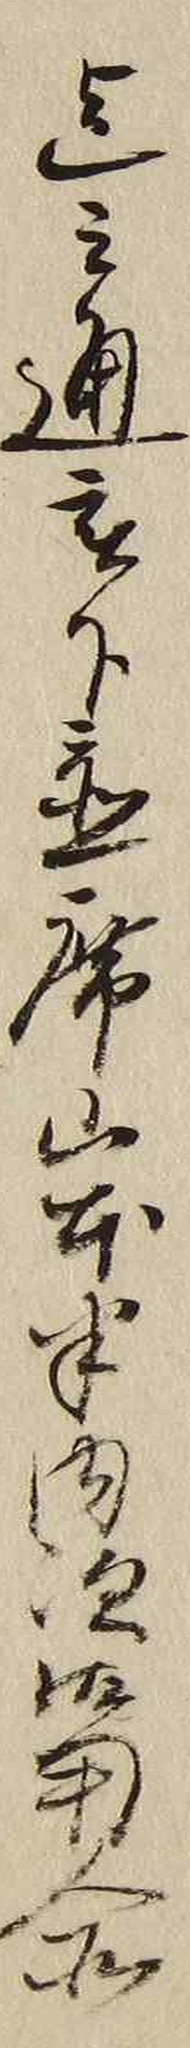迄之通被下置席山本半内次御用人所
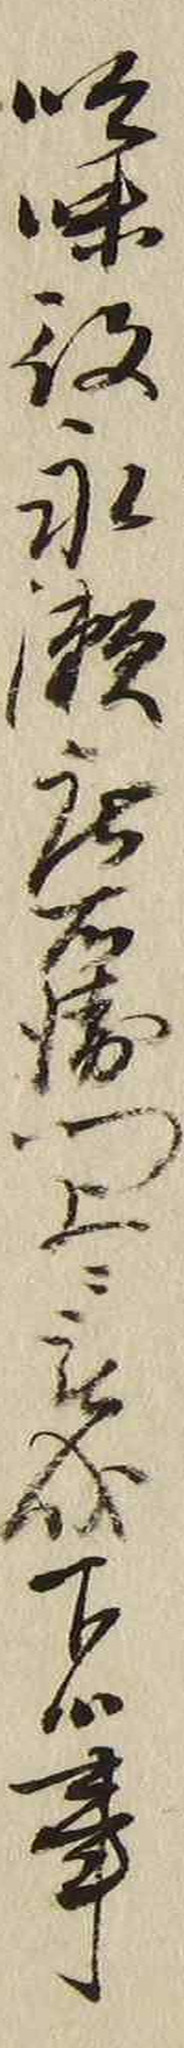吟味役永瀬庄右衛門上被成下候事

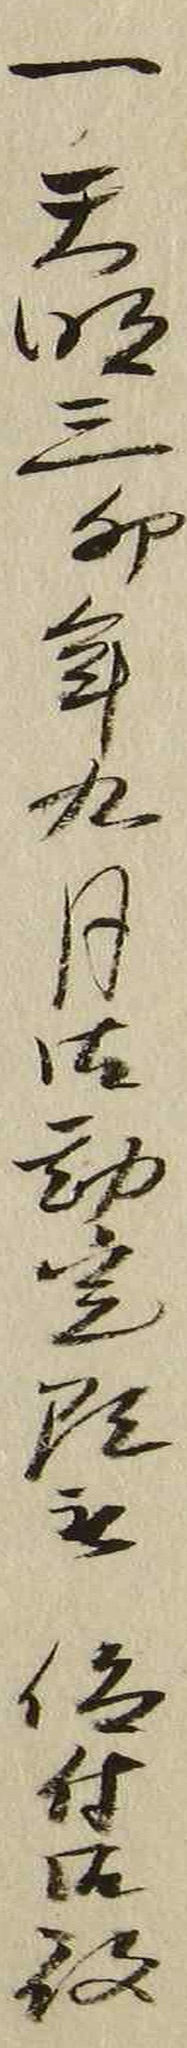一天明三卯年九月御勘定頭被仰付御役
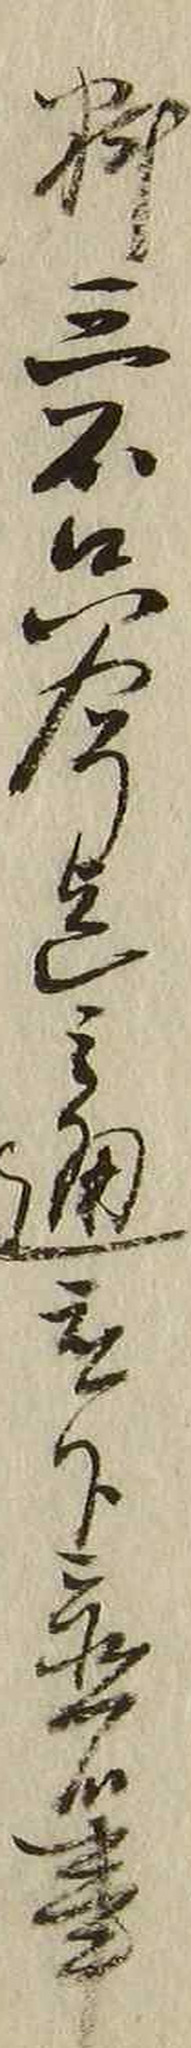料三石只今迄之通被下置候事
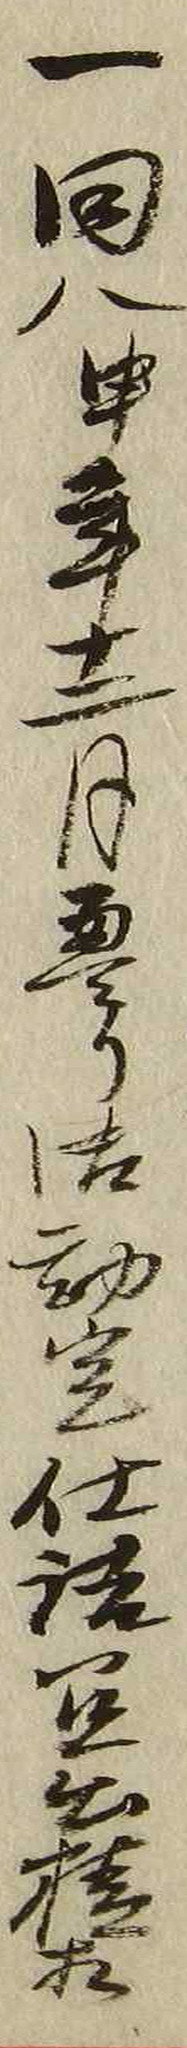一同八申年十二月盈り御勘定仕詰宜出精相
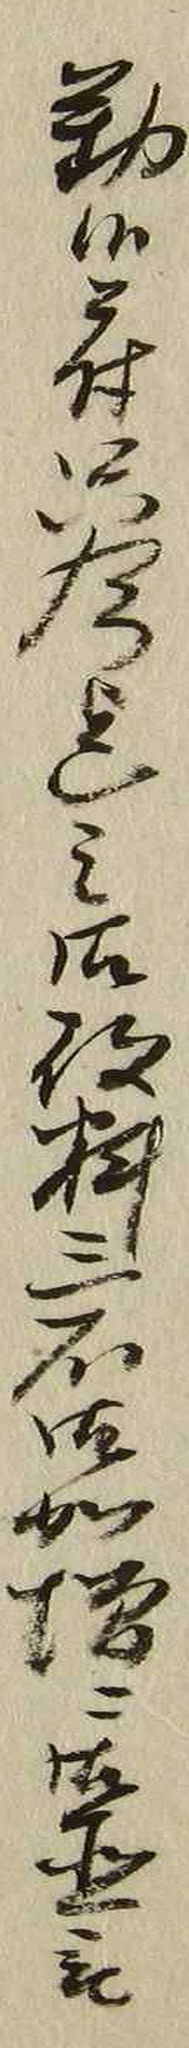勤候付只今迄之御役料三石御加増御直被
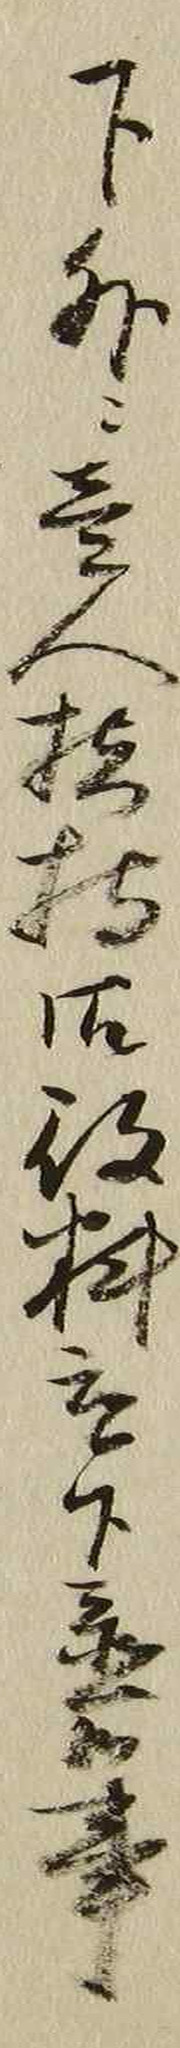下外壱人扶持御役料被下置候事
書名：諸士系譜　巻之350　せ之部1冊全
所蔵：会津若松市立会津図書館
